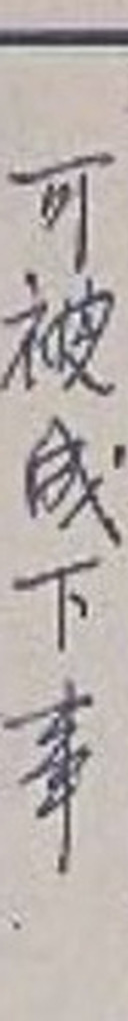可被成下事
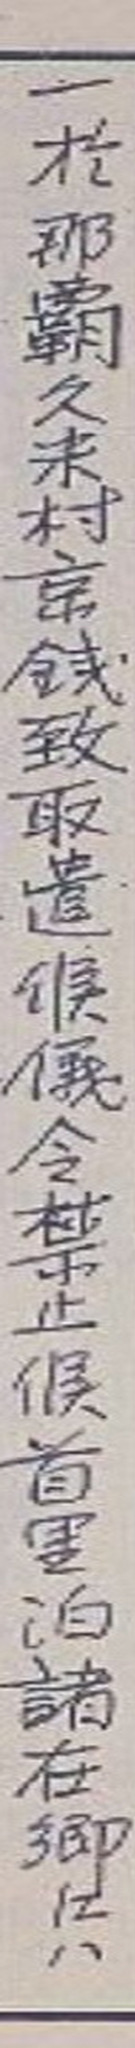一於那覇久米村京銭致取遣候儀令禁止候首里泊諸在郷えは
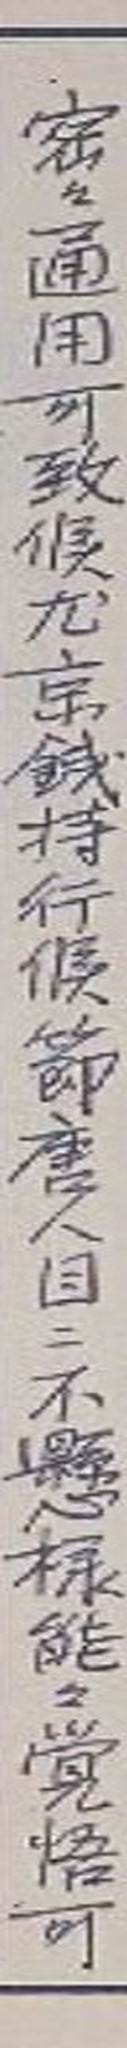密々通用可致候尤京銭持行候節唐人目に不懸様能々覚悟可
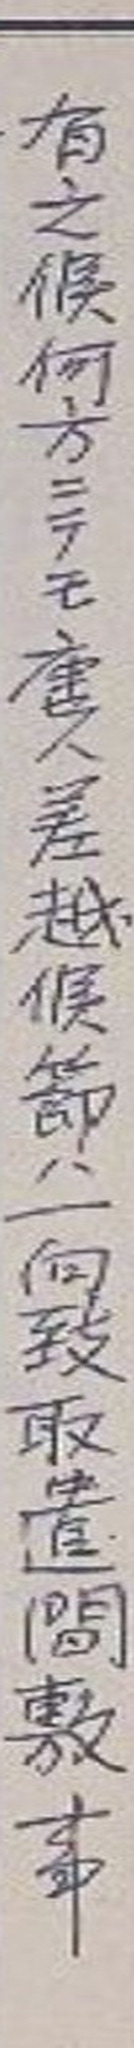有之候何方にても唐人差越候節は一向致取遣間敷事
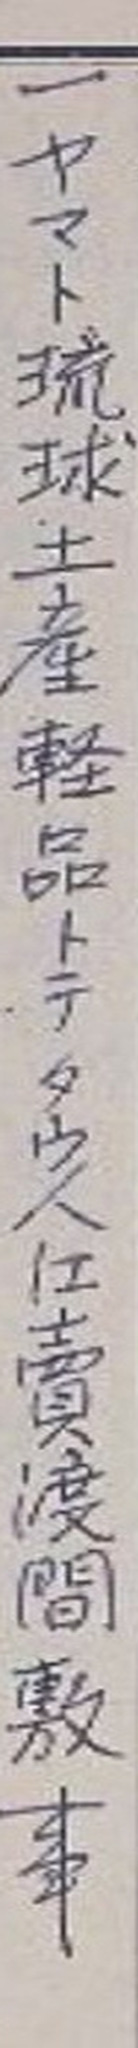一やまと琉球土産軽品とてたう人え売渡間敷事
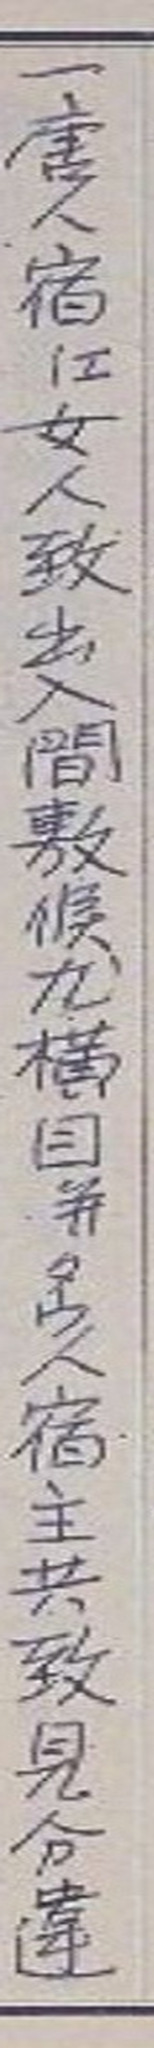一唐人宿え女人致出入間敷候尤横目并たう人宿主共致見分違
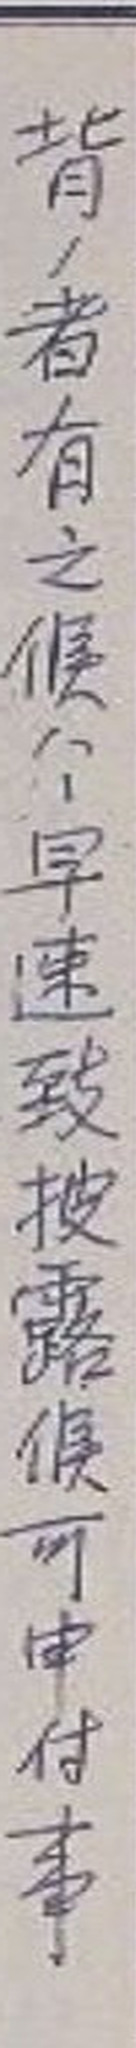背の者有之候はゝ早速致披露候可申付事
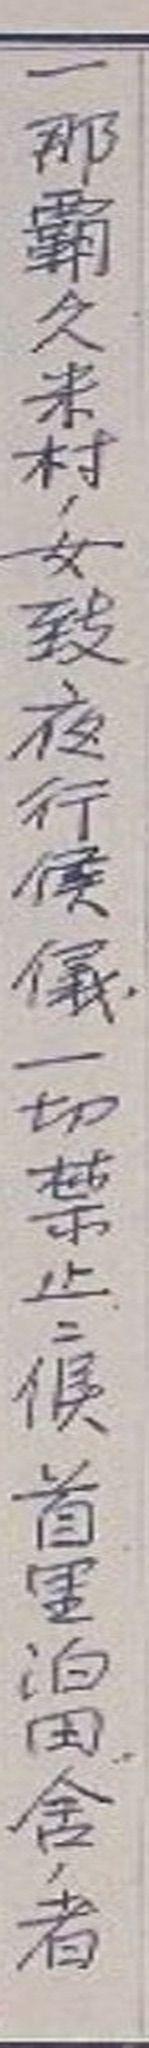一那覇久米村の女致夜行候儀一切禁止に候首里泊田舎の者
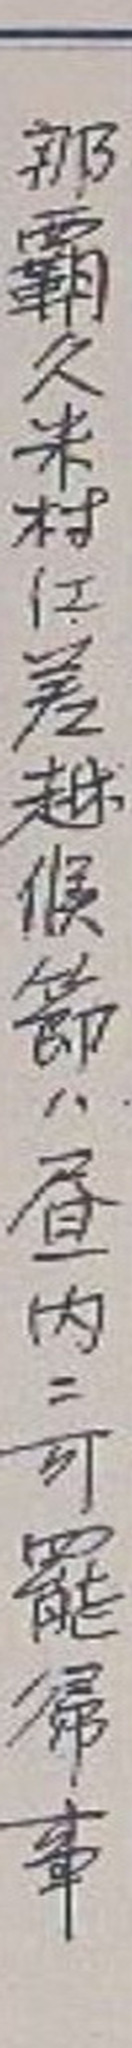那覇久米村え差越候節は昼内に可罷帰事
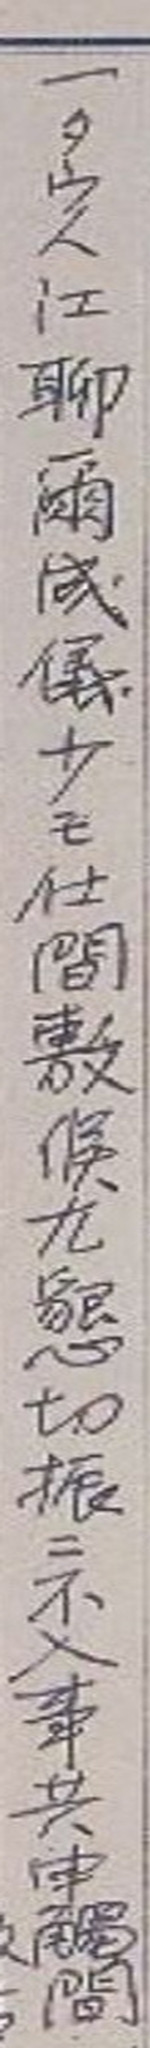一たう人え聊爾成儀少も仕間敷候尤懇切振に不入事共申触間敷事

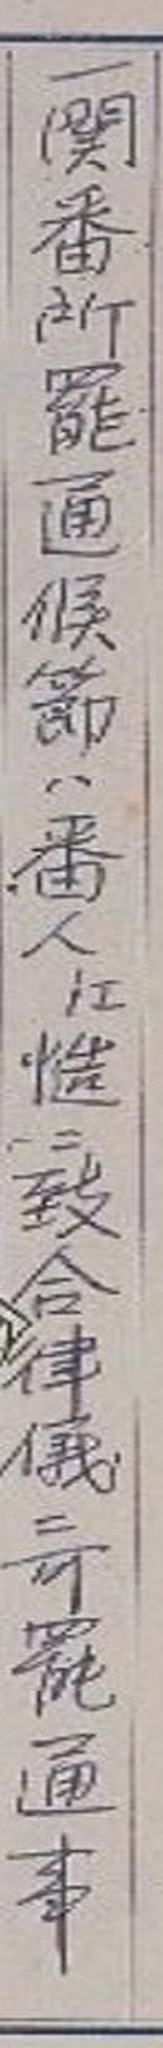一関番所罷通候節は番人え慥に致合図律儀に罷通事
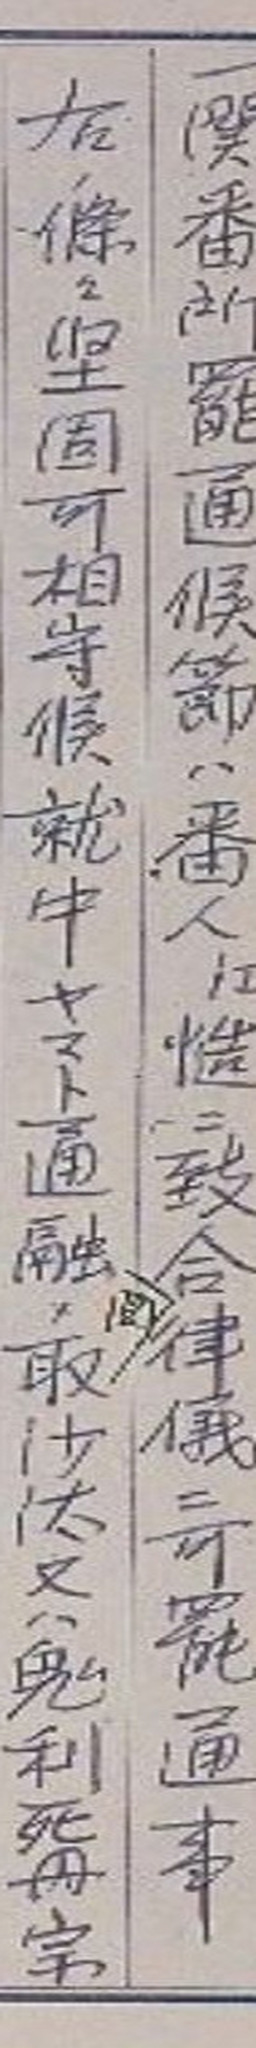右の条々堅固可相守候就中やまと通融の取沙汰又は鬼利死丹宗
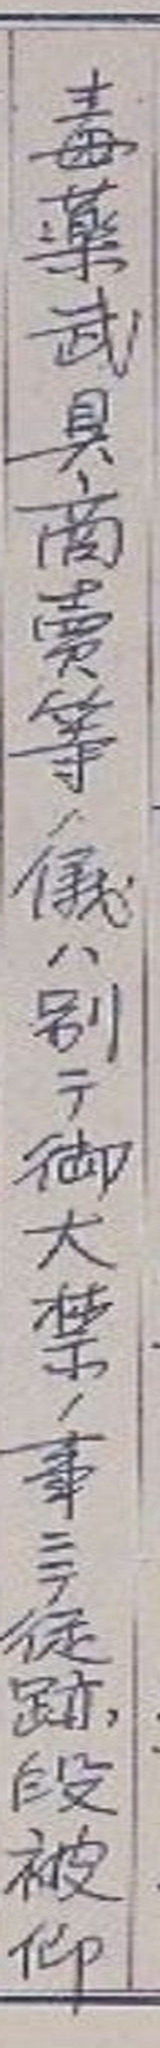毒薬武具商売等の儀は別て御大禁の事にて従跡段被仰
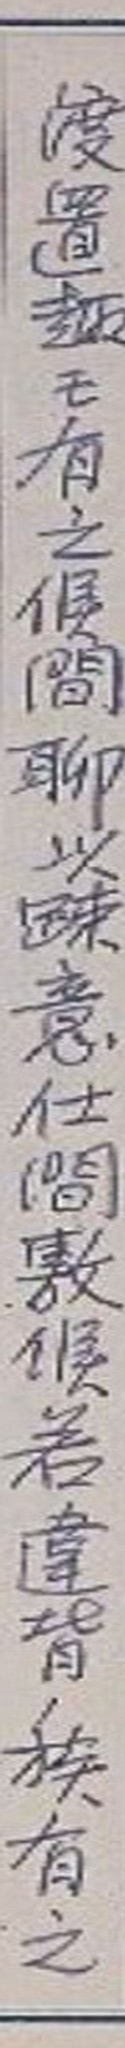渡置趣も有之候間聊以疎意仕間敷候若違背の族有之
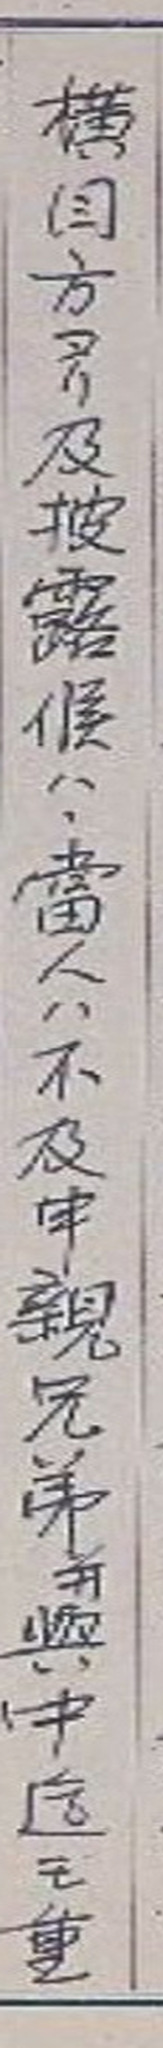横目方より及披露候はゝ当人は不及申親兄弟并与中迄も重
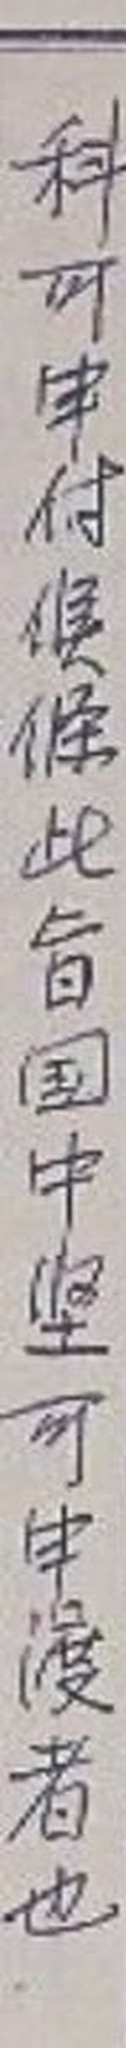科可申付候条此旨国中堅可申渡者也
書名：支那冊封使来琉諸記 下巻
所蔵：University of the Ryukyus Library
